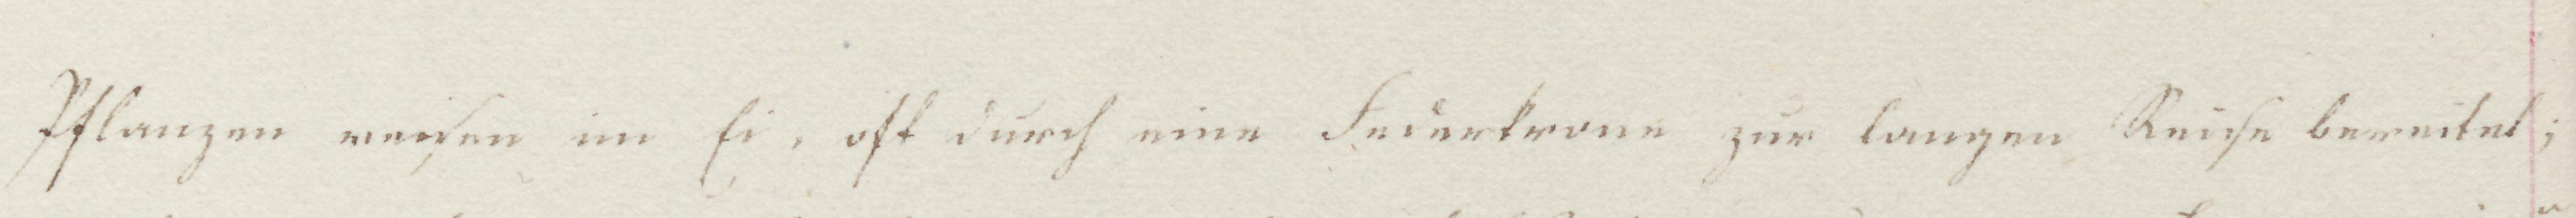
Pflanzen reisen im Ei, oft durch eine Federkrone zur langen Reise bereitet;
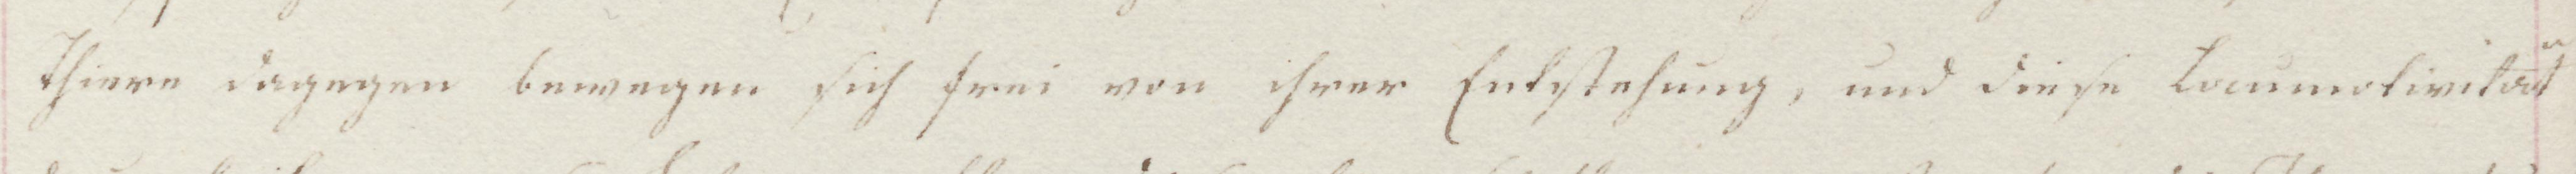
Thiere dagegen bewegen sich frei von ihrer Entstehung, und diese Locumotivität
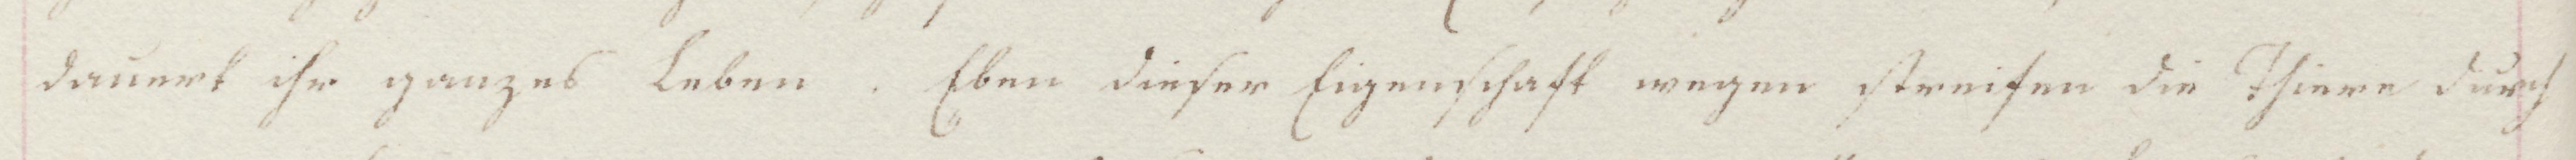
dauert ihr ganzes Leben. Eben dieser Eigenschaft wegen streifen die Thiere durch
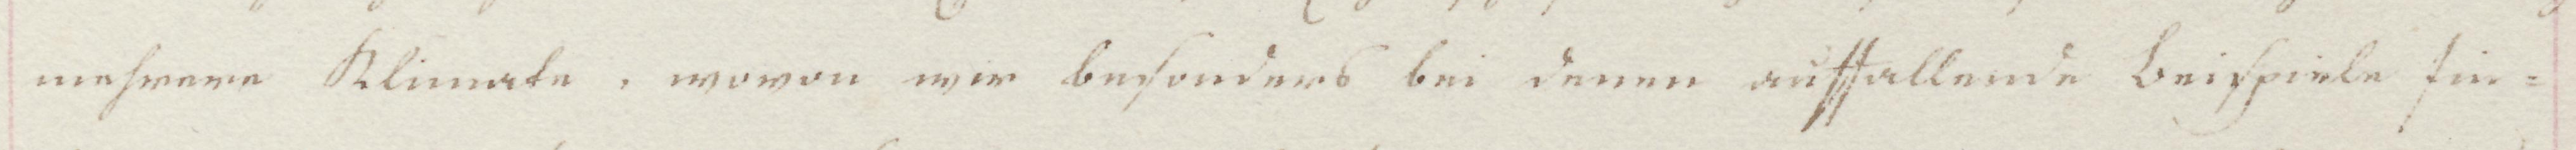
mehrere Klimate, wovon wir besonders bei denen auffallende Beispiele fin-
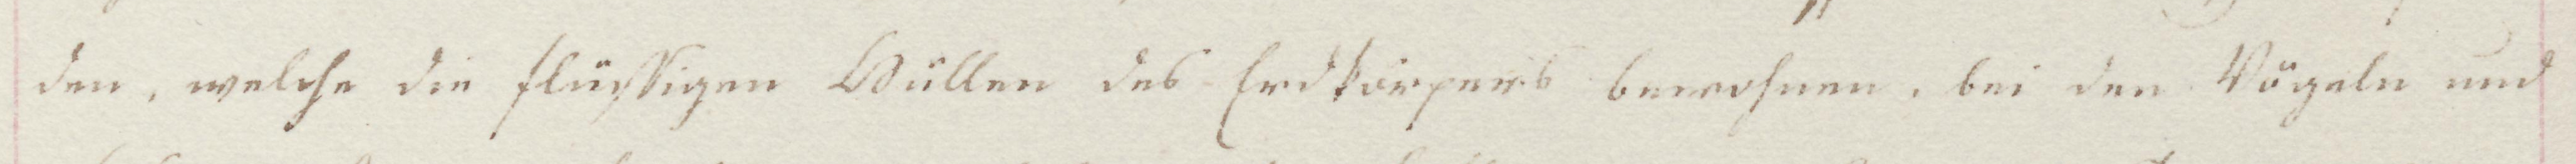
den, welche die flüssigen Hüllen des Erdkörpers bewohnen, bei den Vögeln und
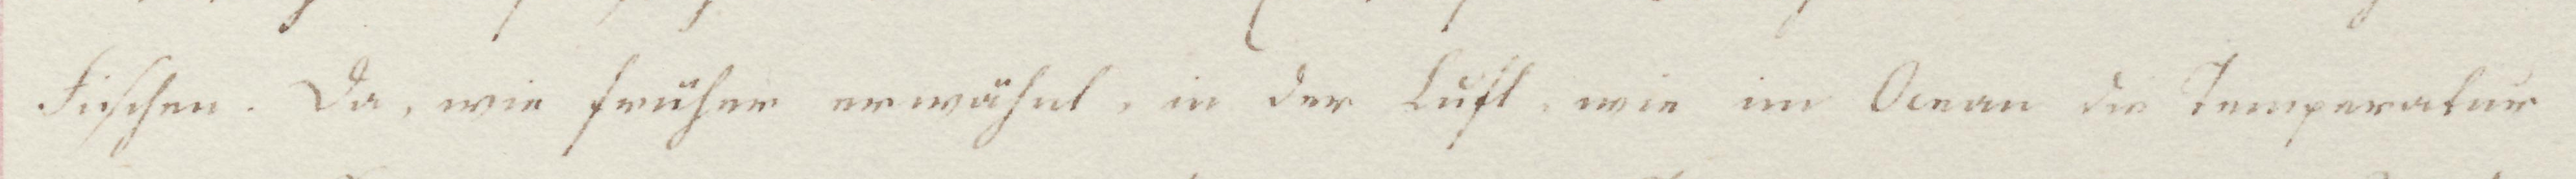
Fischen. Da, wie früher erwähnt, in der Luft, wie im Ocean die Temperatur
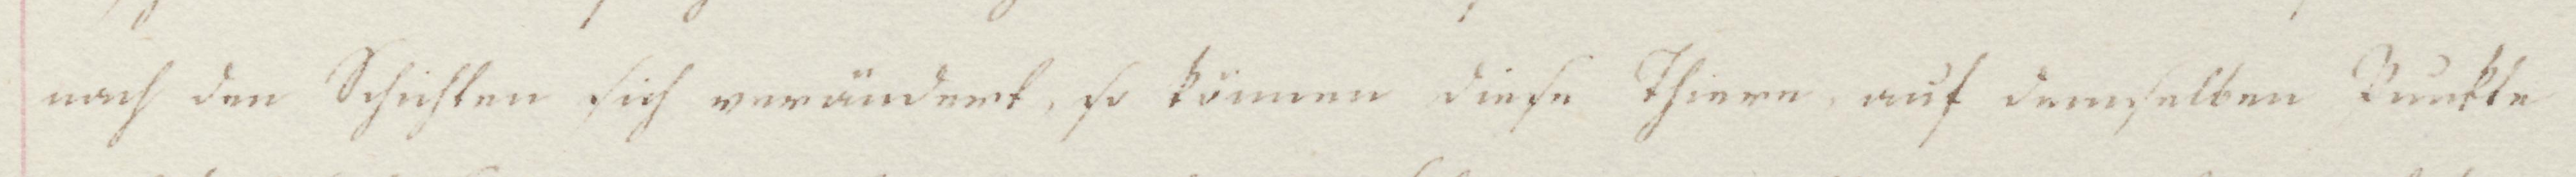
nach den Schichten sich verändert, so können diese Thiere auf demselben Punkte
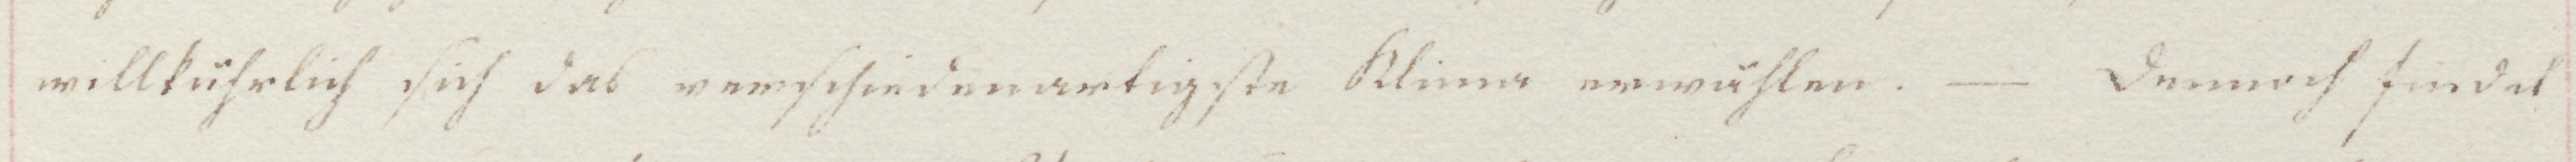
willkürlich sich das verschiedenartigste Klima erwählen. – Dennoch findet
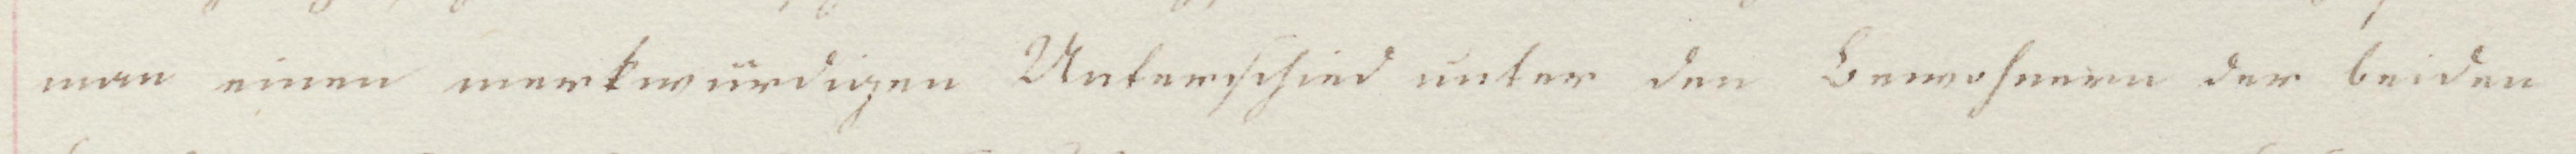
man einen merkwürdigen Unterschied unter den Bewohnern der beiden
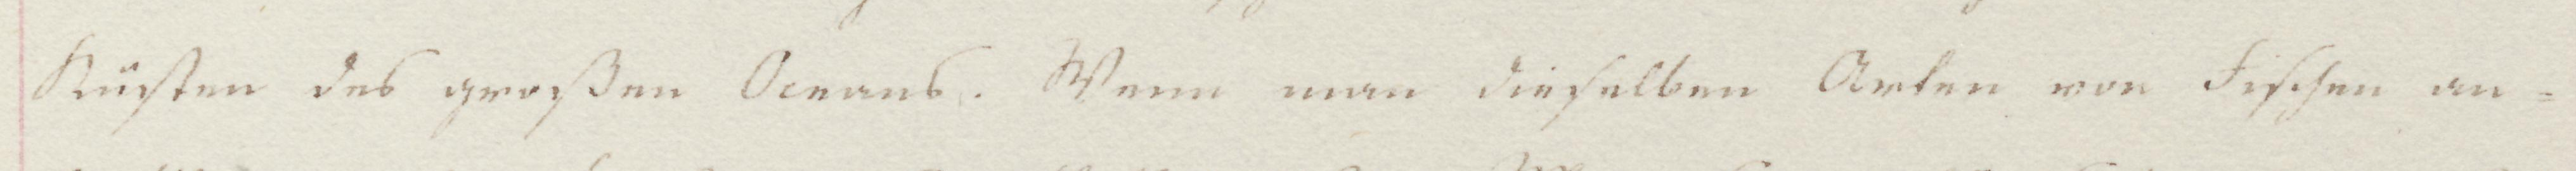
Küsten des großen Oceans. Wenn man dieselben Arten von Fischen an-
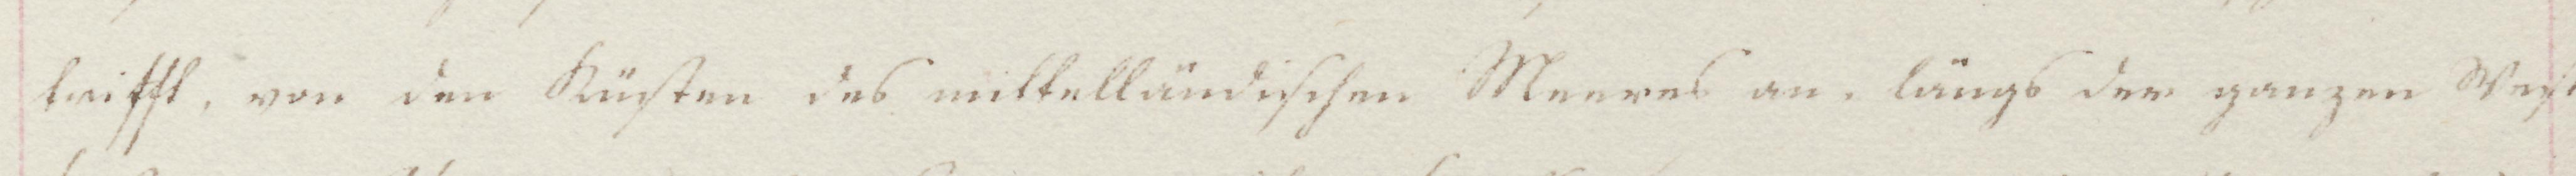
trifft, von den Küsten des mittelländischen Meeres an, längs der ganzen West-
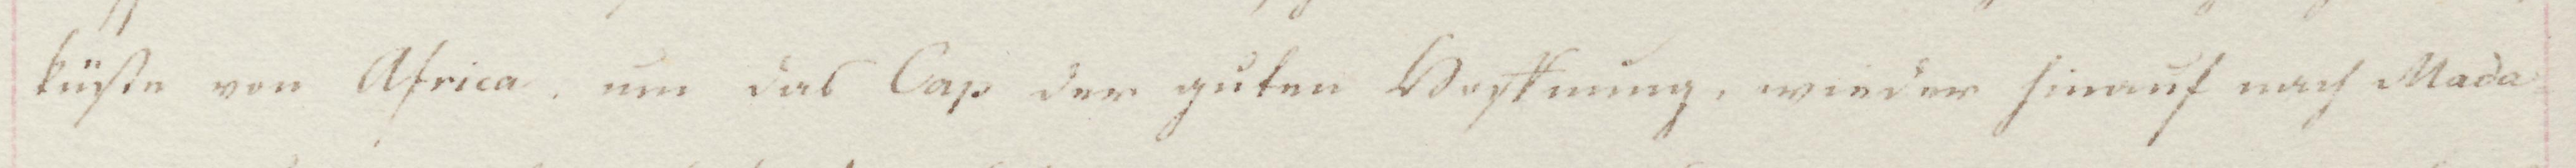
küste von Africa, um das Cap der guten Hoffnung, wieder hinauf nach Mada-
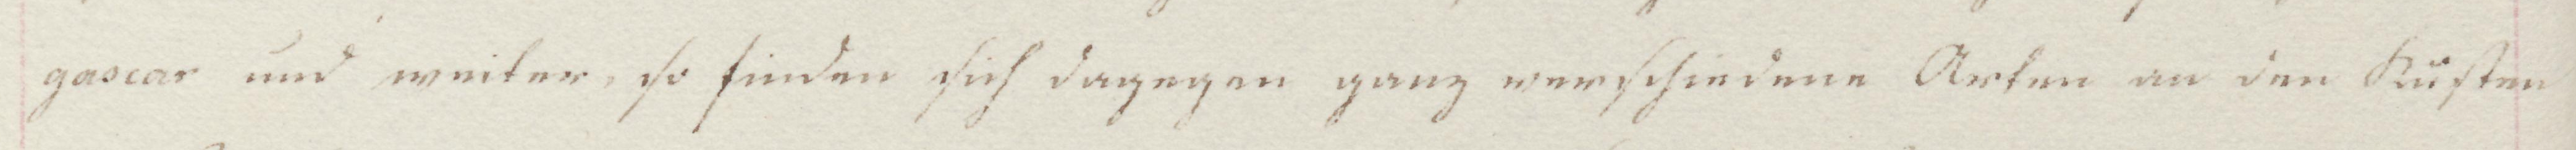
gascar und weiter, so finden sich dagegen ganz verschiedene Arten an den Küsten
